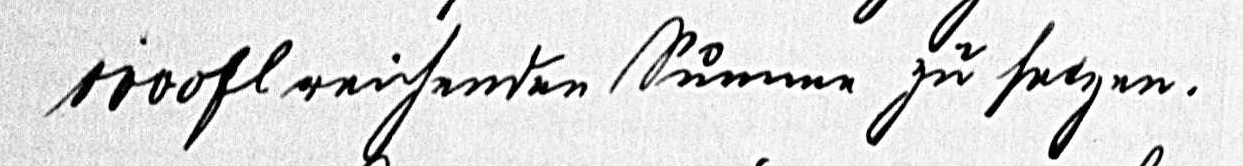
1000fl reichenden Summe zu setzen.
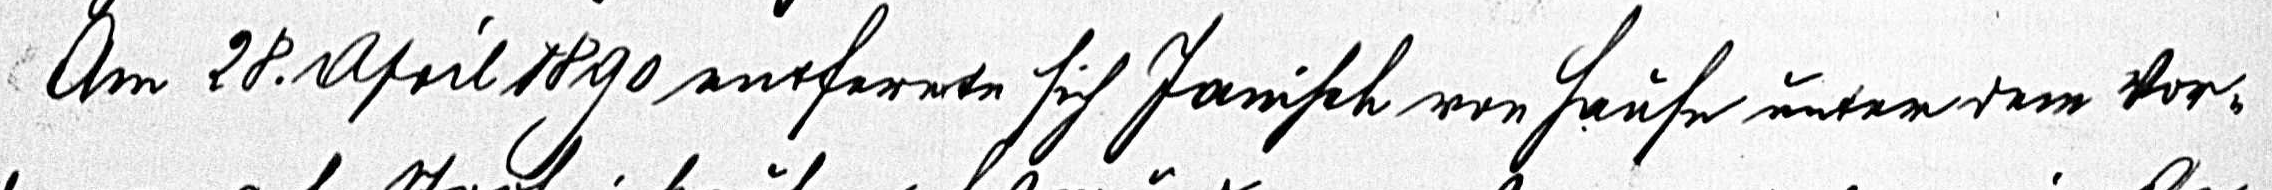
Am 28. April 1890 entfernte sich Janisch von Hause unter dem Vor¬
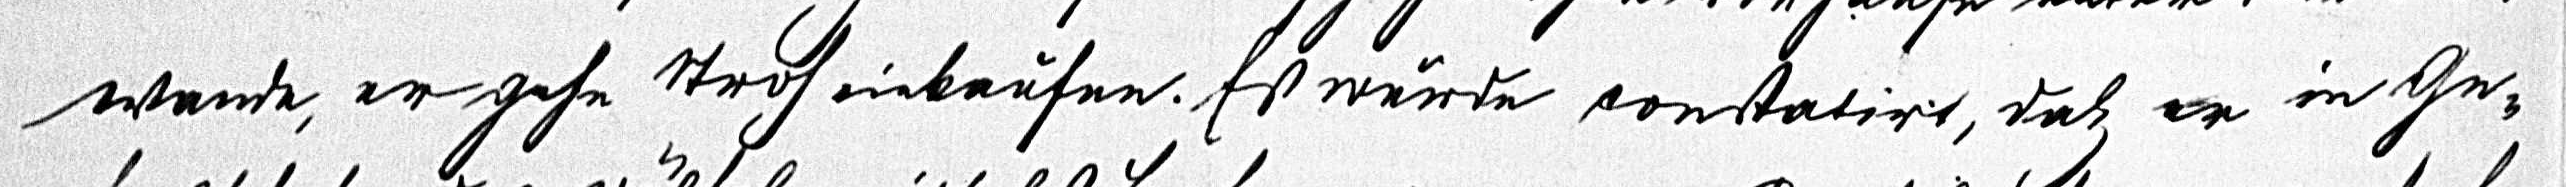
wande er gehe Stroh einkaufen. Es wurde constatirt, das er in Ge¬
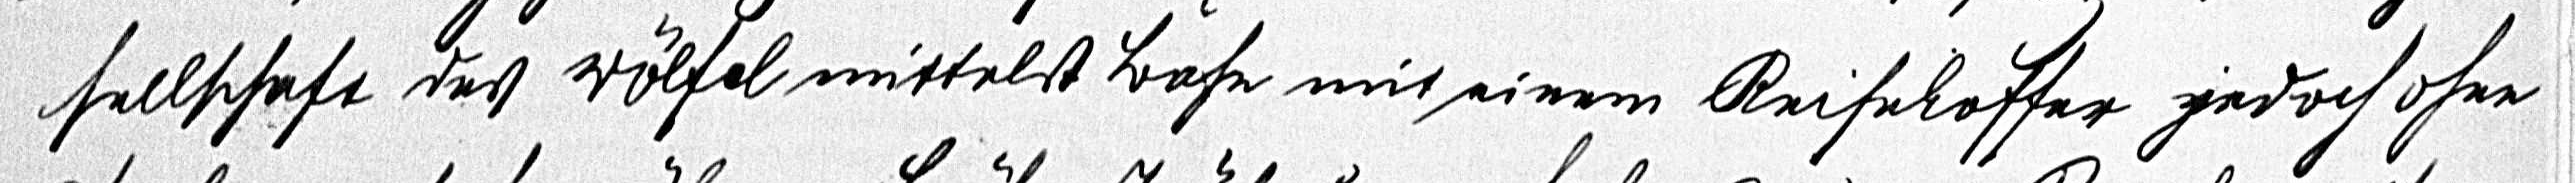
sellschaft des Wölfel mittelst Bahn mit einem Reisekoffer jedoch ohne
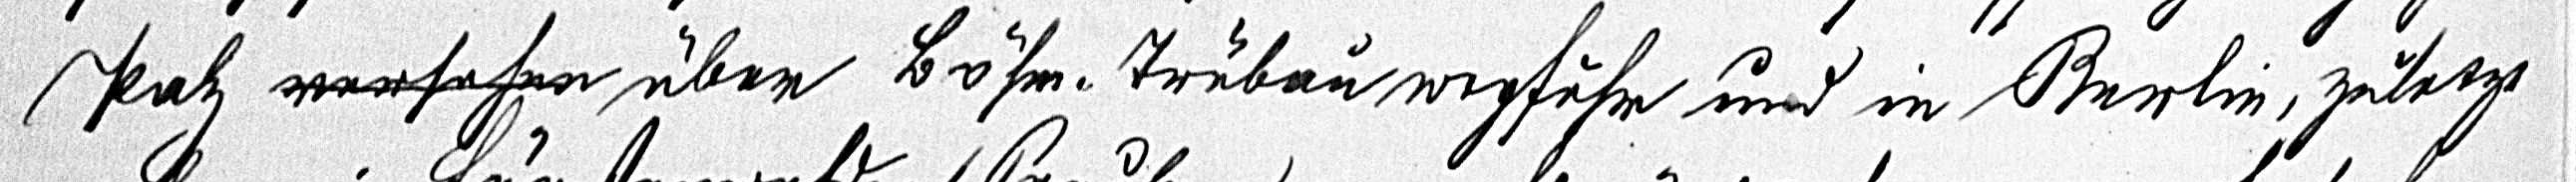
Paß über Böhm. Trübau wegfuhr und in Berlin, zuletzt
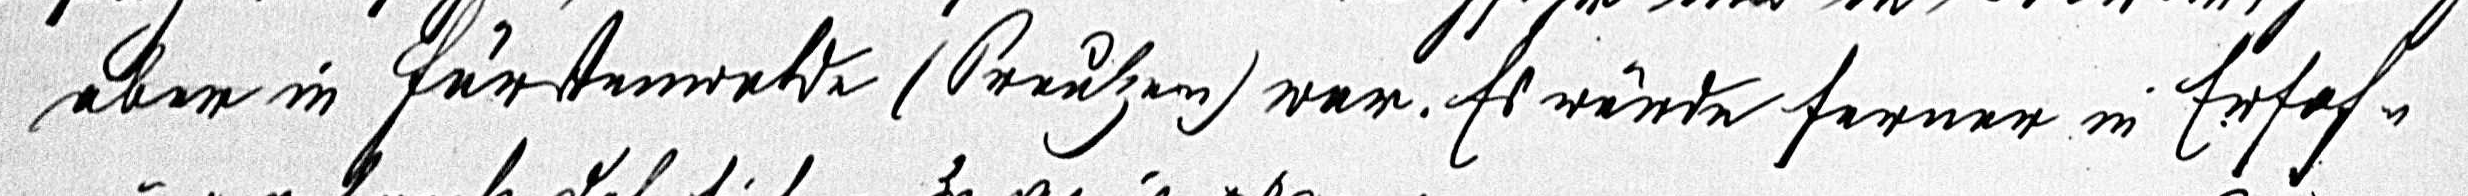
aber in Fürtenwald (Preußen) war. Es würde ferner in Erfah¬
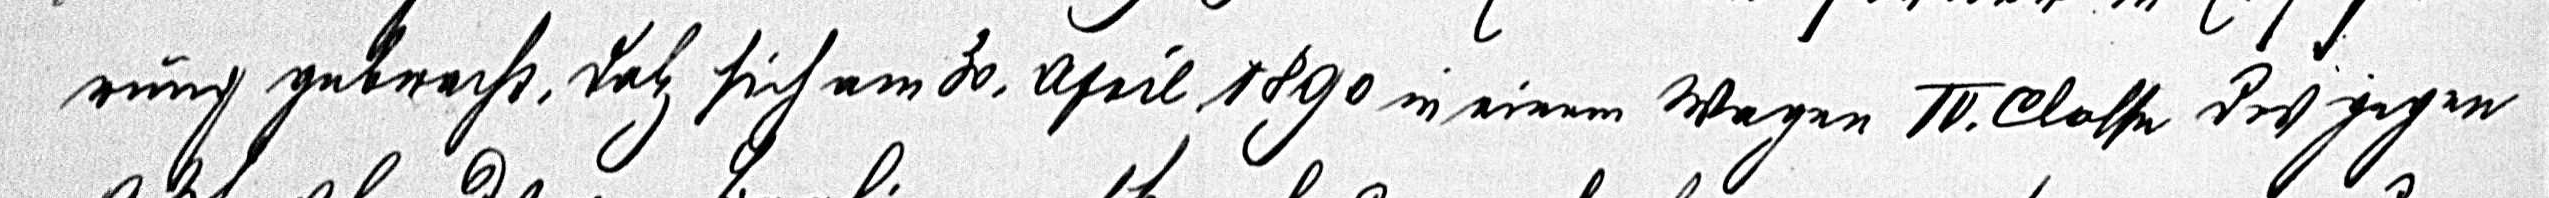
rung gebracht, daß sich am 30. April 1890 in einem Wagen IV Classe des gegen
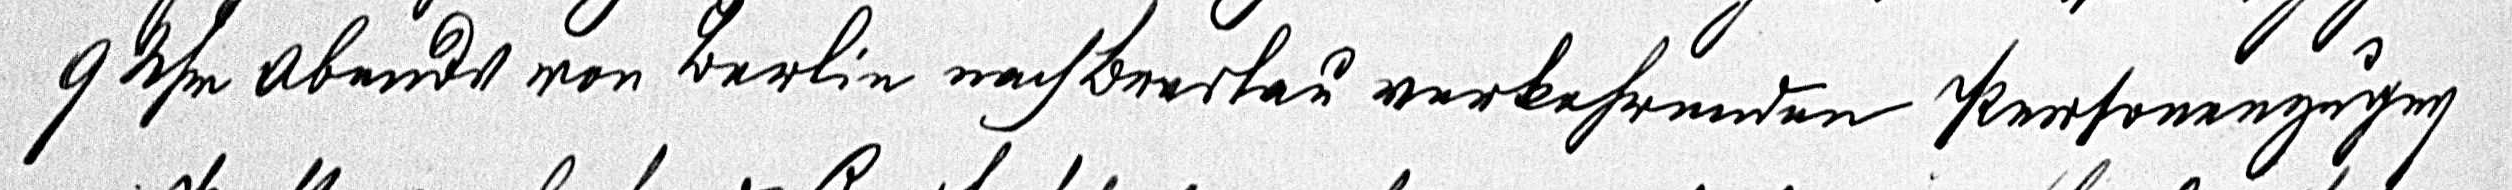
9 Uhr Abends von Berlin nach Breslau verkehrenden Personenzuges
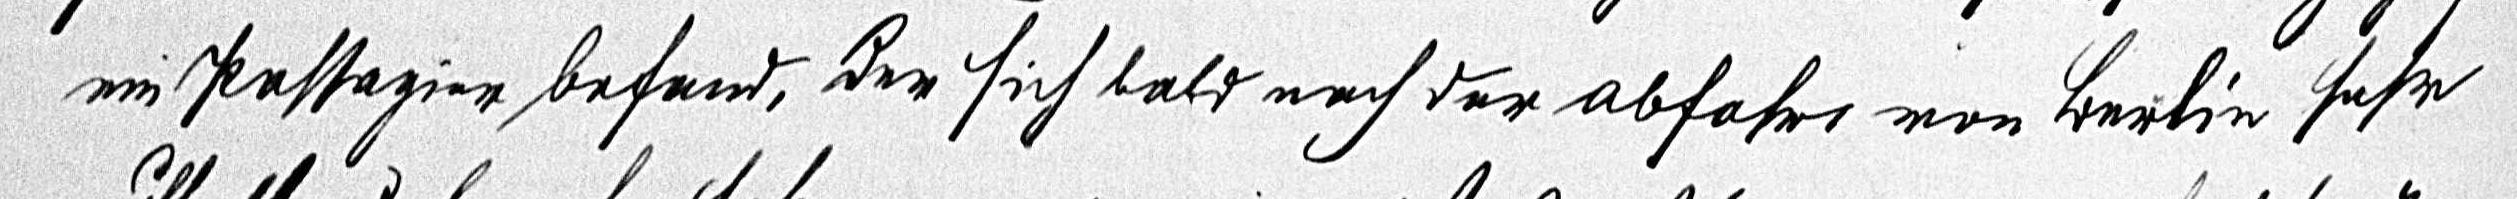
ein Passagier befand, der sich bald nach der Abfahrt von Berlin sehr
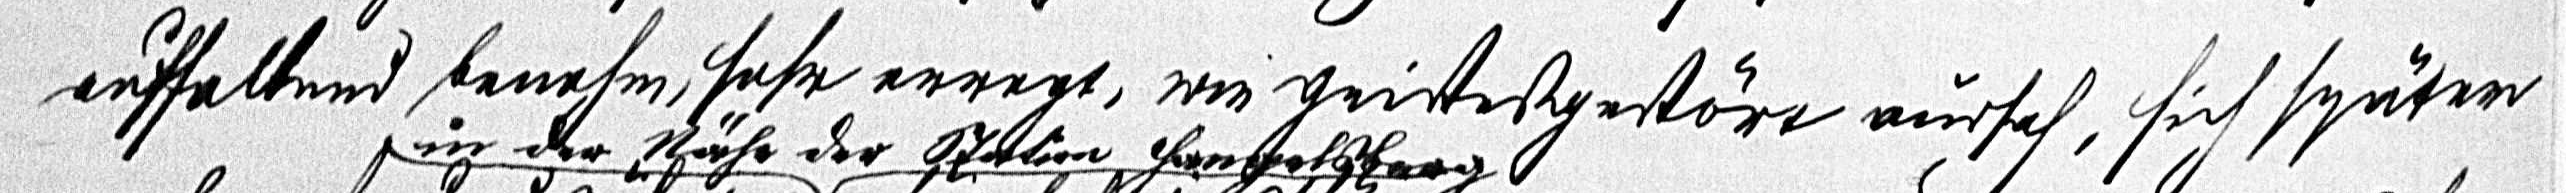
auffallend benahm, sehr erregt, wie geistesgestört aussah, sich spatter
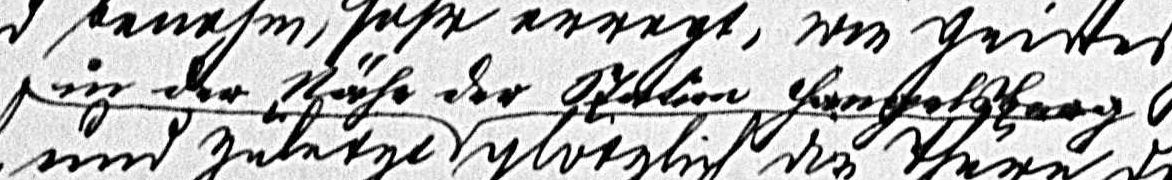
in der Nähe der Station Hangelsberg
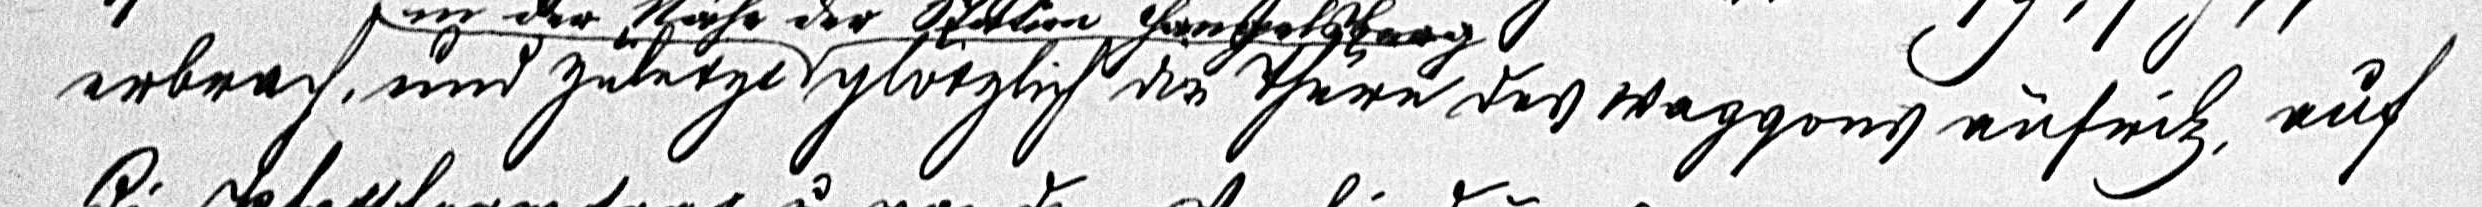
erbrach, und zuletzt plötzlich die Thüre des Waggons aufriß, auf
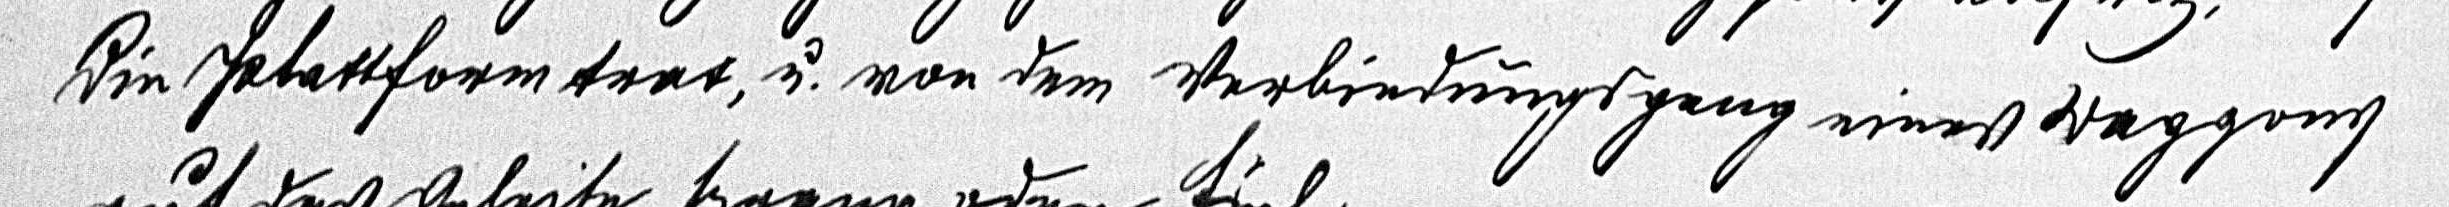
die Plattform trat, u. von dem Verbindungsgang eines Waggons
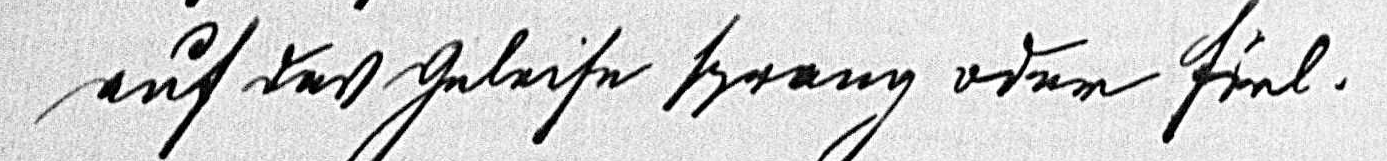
auf das Geleise sprang oder fiel.
